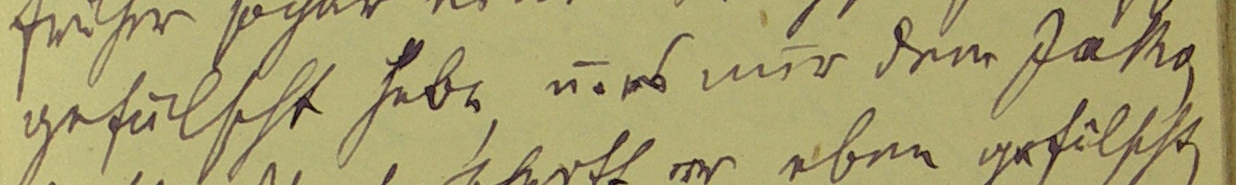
gefälscht habe, und es nur dem Jakob
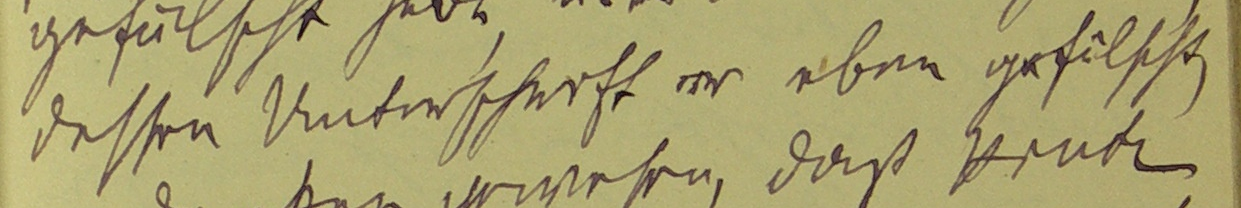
dessen Unterschrift er eben gefälscht
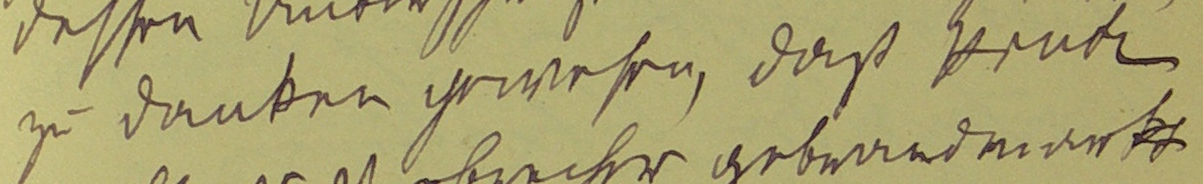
zu danken gewesen, daß Hintz
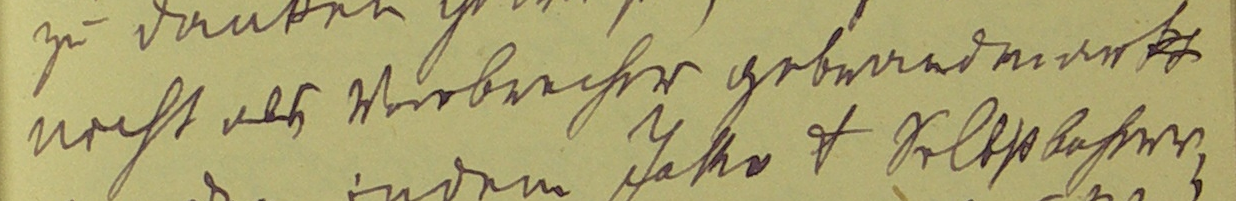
nicht als Verbrecher gebrandmarkt
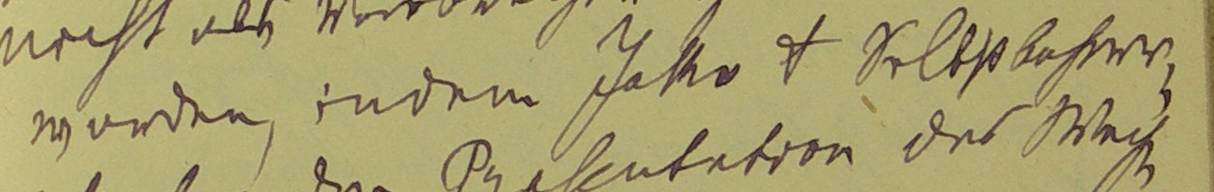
worden; indem Jako mit Selbstbeherr¬
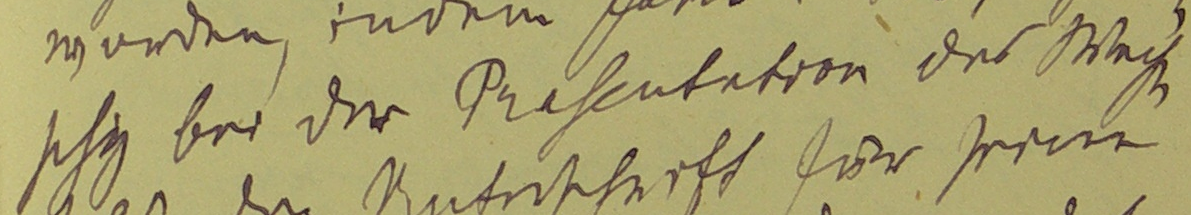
schung bei der Presentation des Wech¬
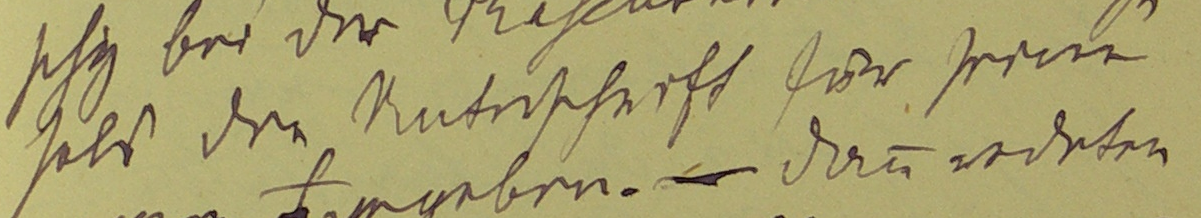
sels die Unterschrift für seine
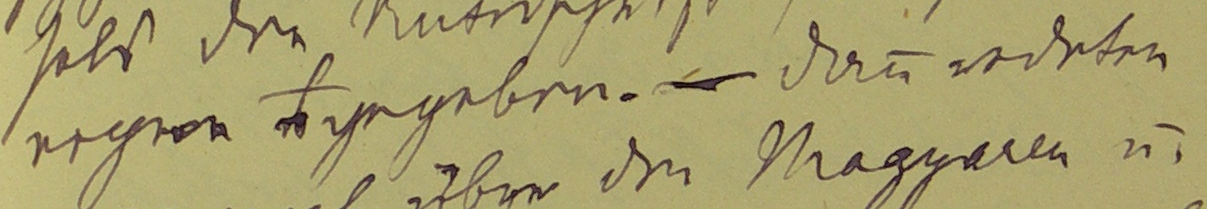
eigene angegeben. -Dann redeten
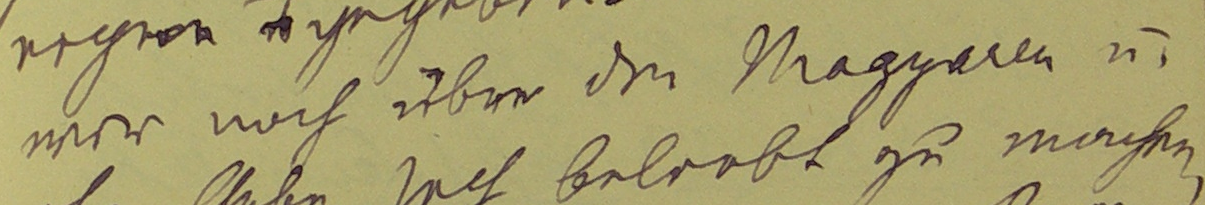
wir noch über den Magyaren und
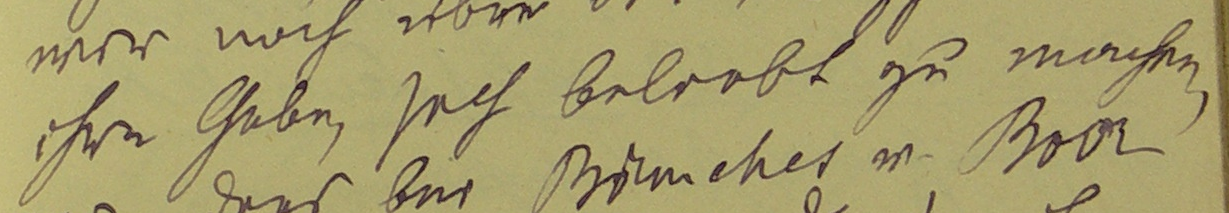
Ihre Gabe, sich beliebt zu machen
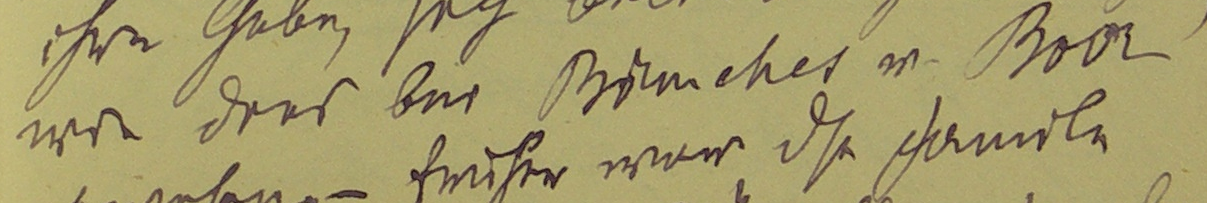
wie dieses bei Bömches von Boor
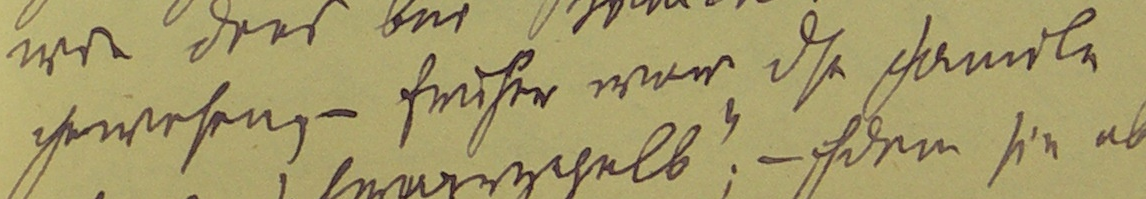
gewesen- Früher war diese Familie
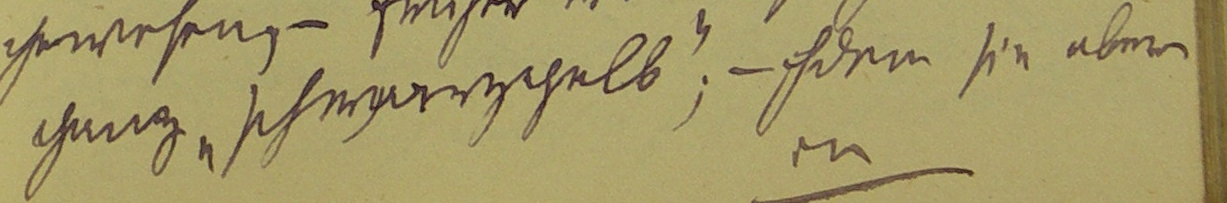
ganz „ schwarzgelb“: - Indem sie aber
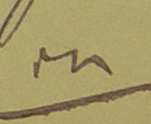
in
